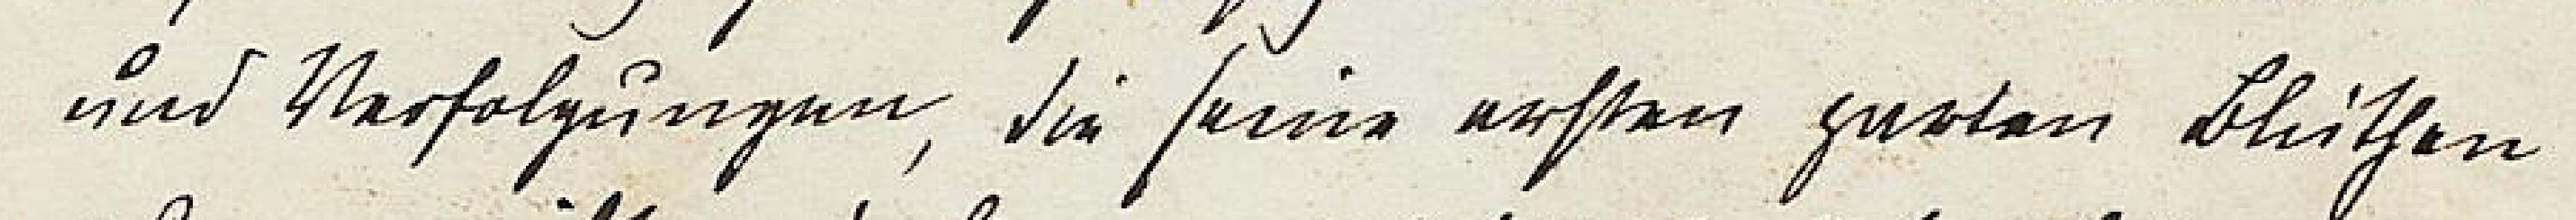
und Verfolgungen, die seine ersten zarten Blüthen
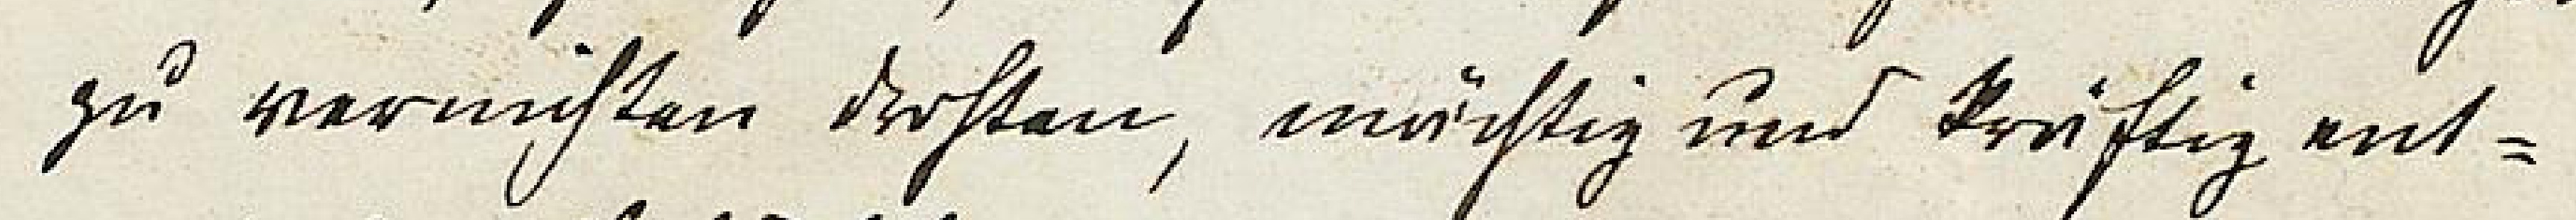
zu vernichten drohten, mächtig und kräftig ent¬
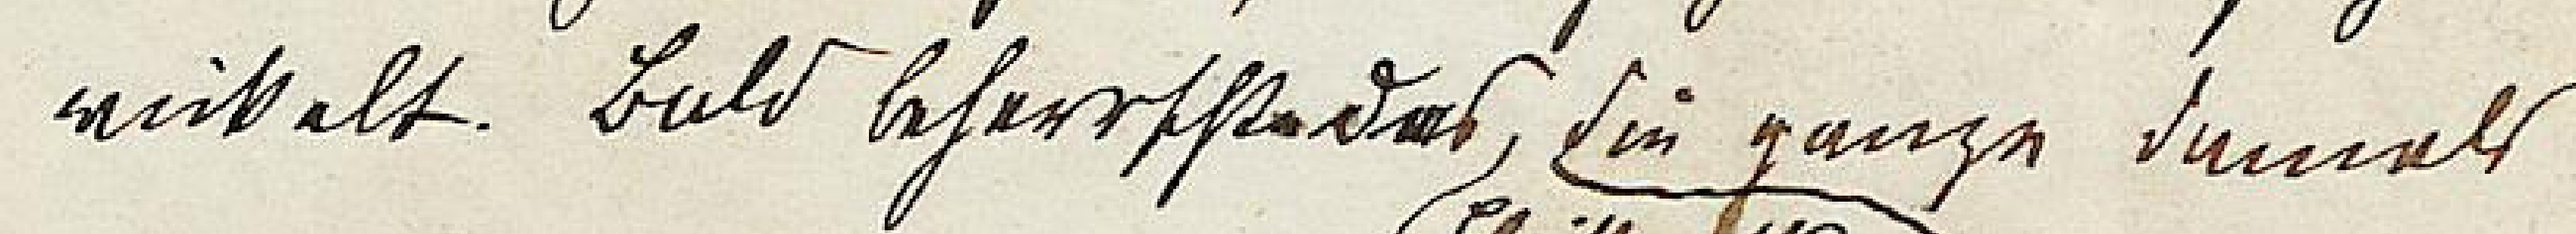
wickelt. Bald beherrschte das die ganze damals
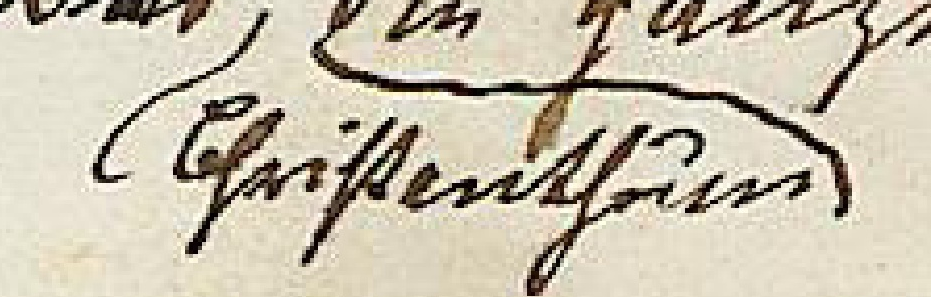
Christenthum
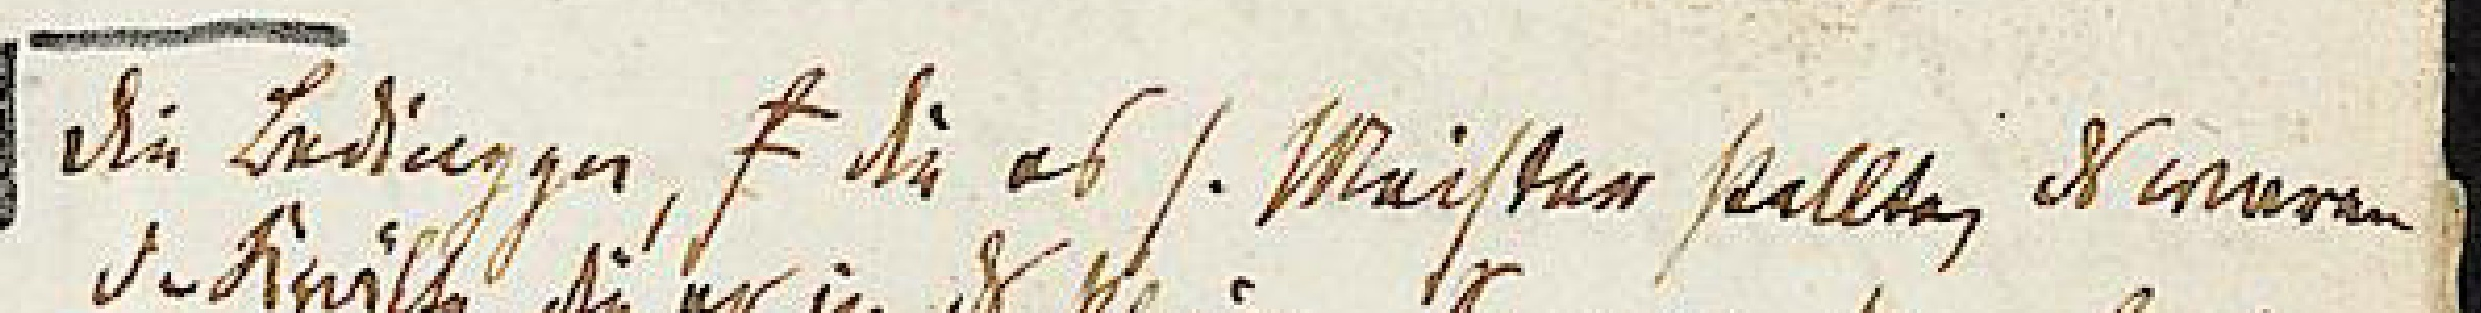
die Bedinggn, f die es s. Meister stellte. ds waren
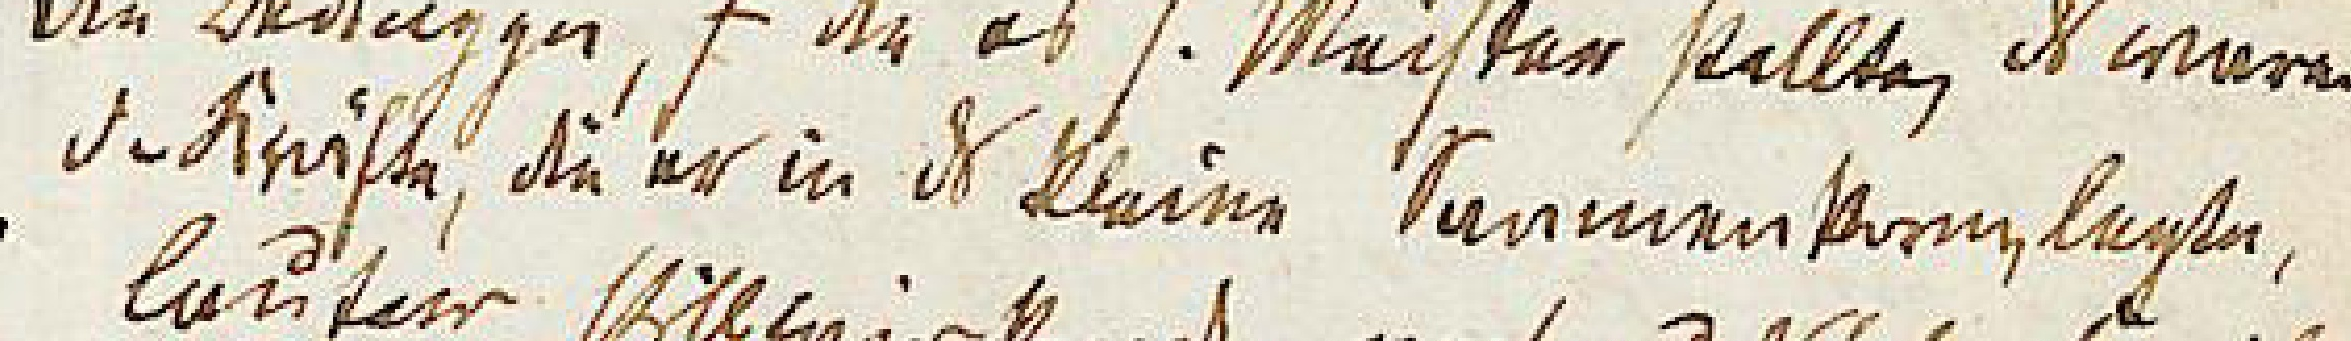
die Kräfte, die er in ds kleine Samenkorn, legte,
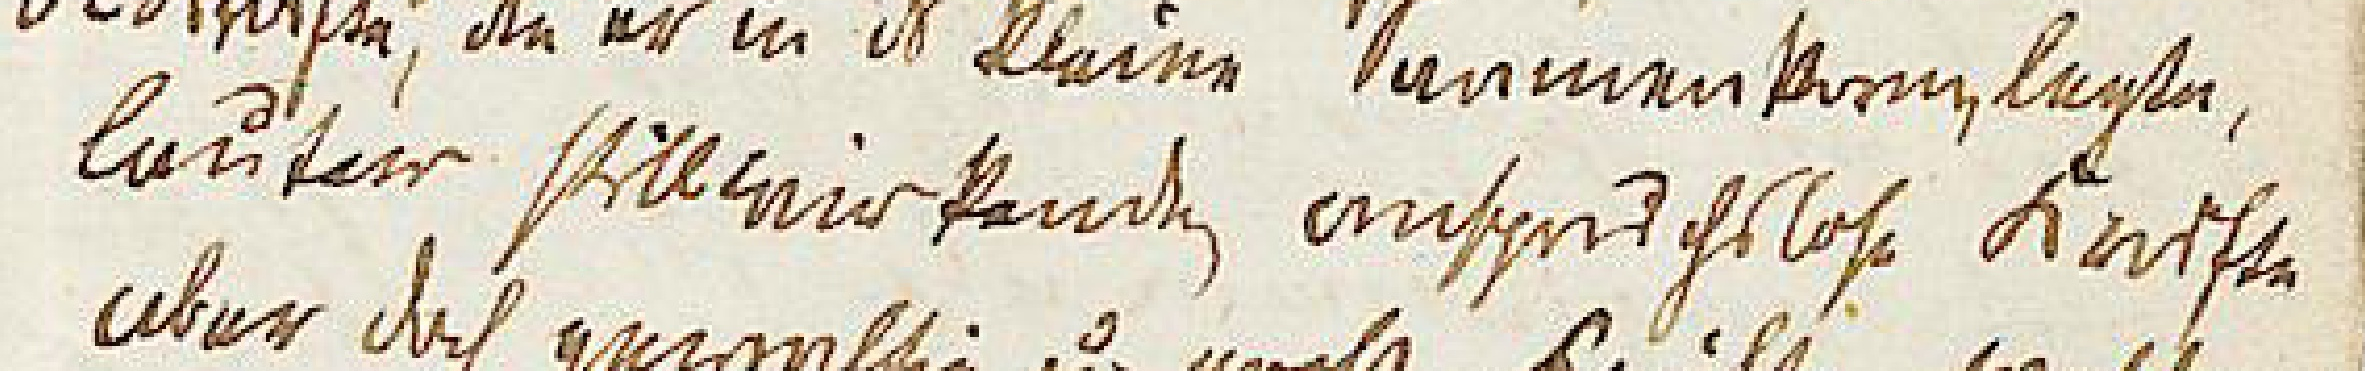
lauter stillwirkend, anspruchslose Kräfte
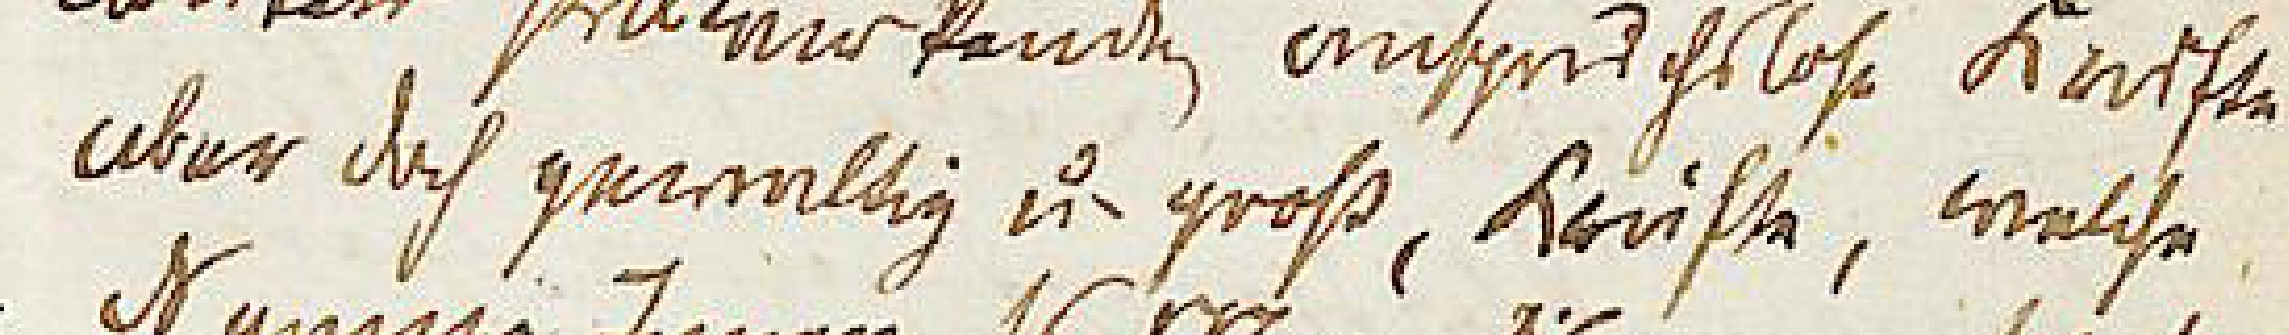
aber doch gewaltig u. groß, Kräfte, welche
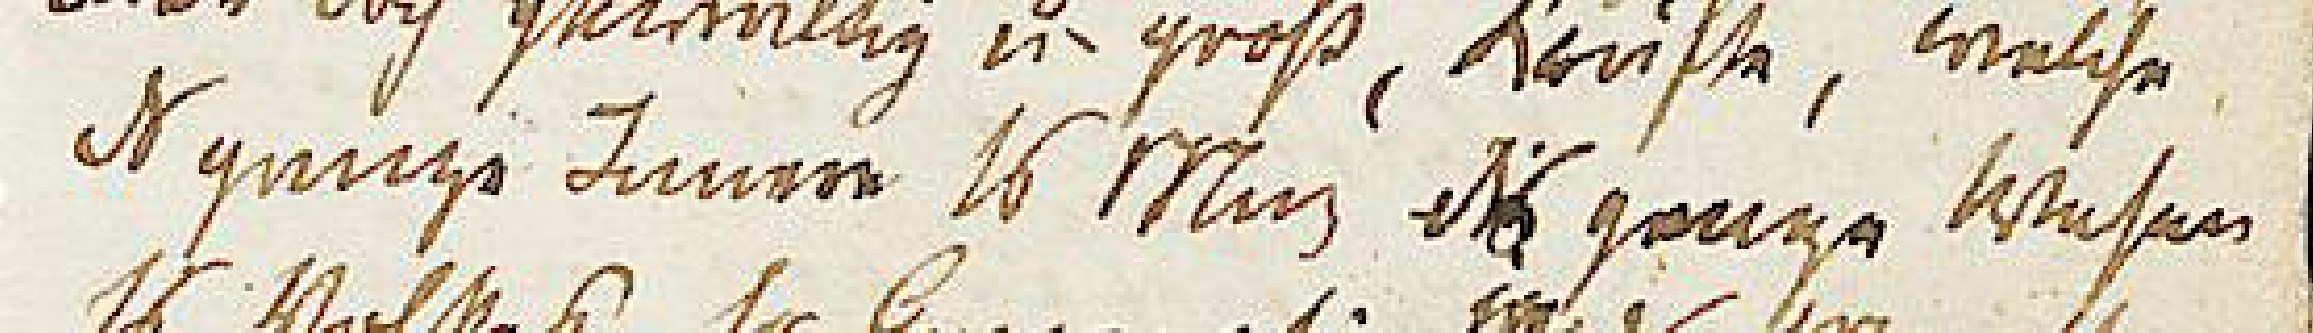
ds ganze Innere 1s Mns ds ganze Wesen
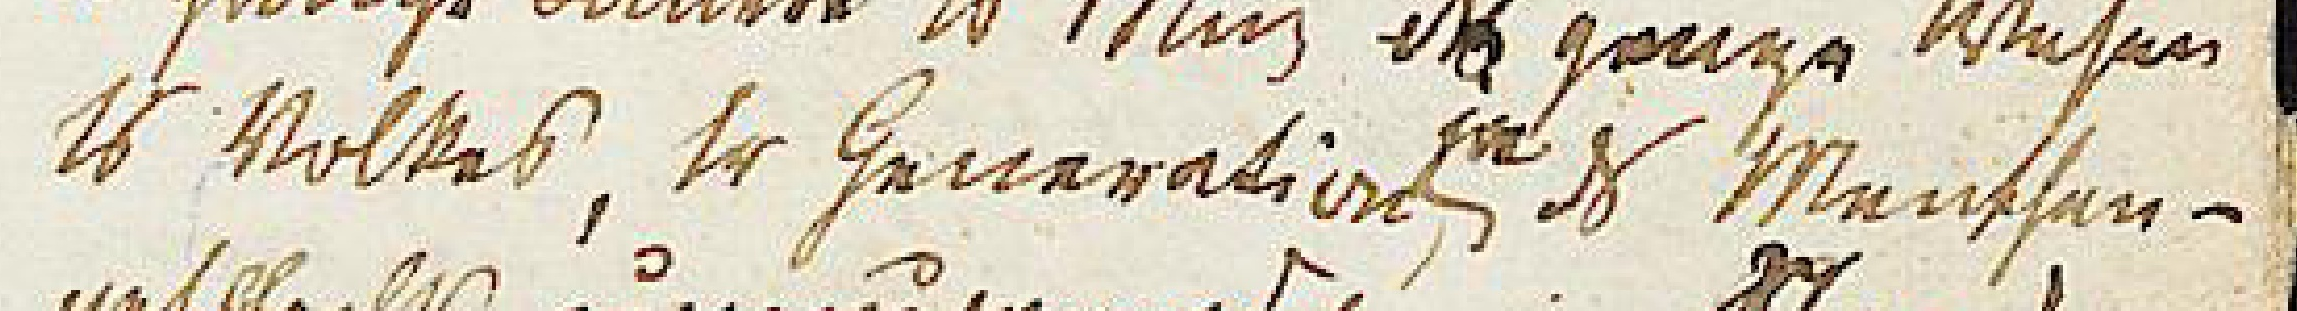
1s Volkes, 1r Generation, ja ds Menschen¬
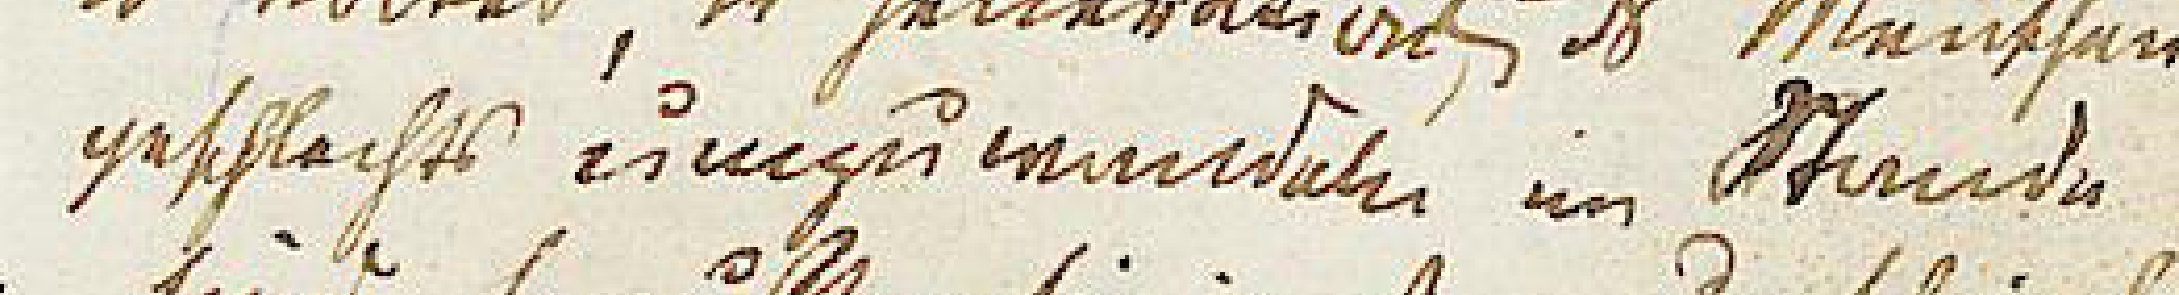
geschlechts umzuwandeln im Stande
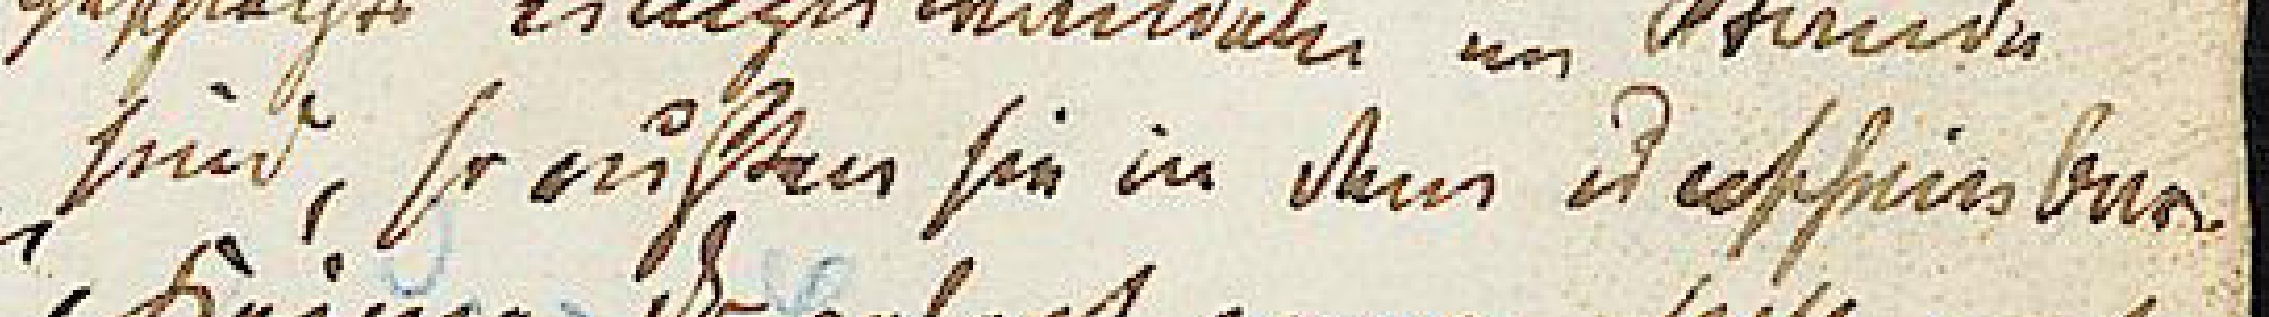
sind, so ruften sie in dem unscheinbar.
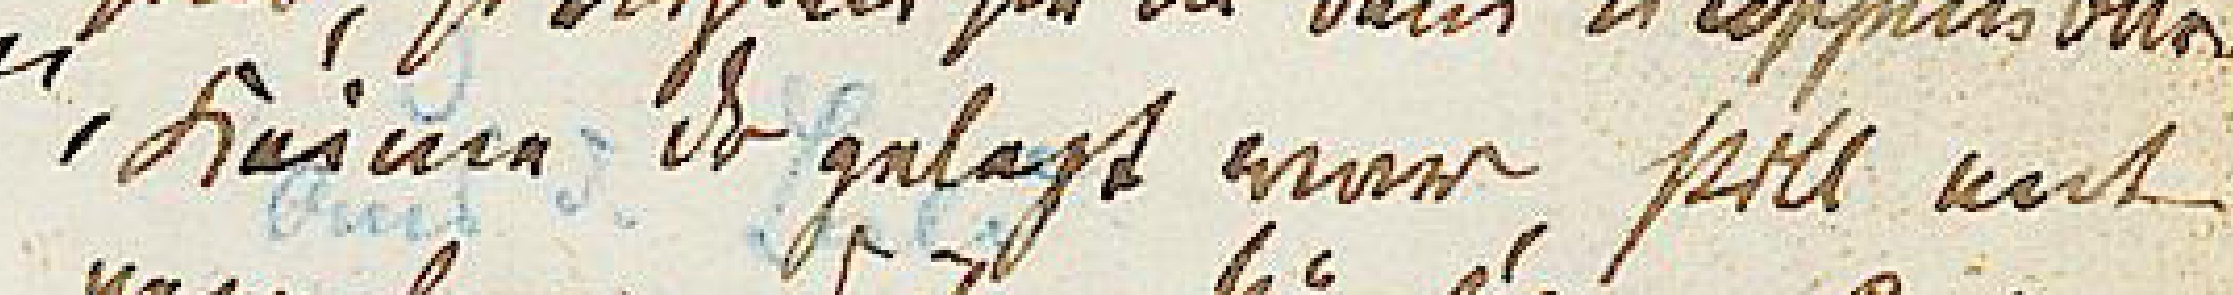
Keime der gelegt war, still ent¬
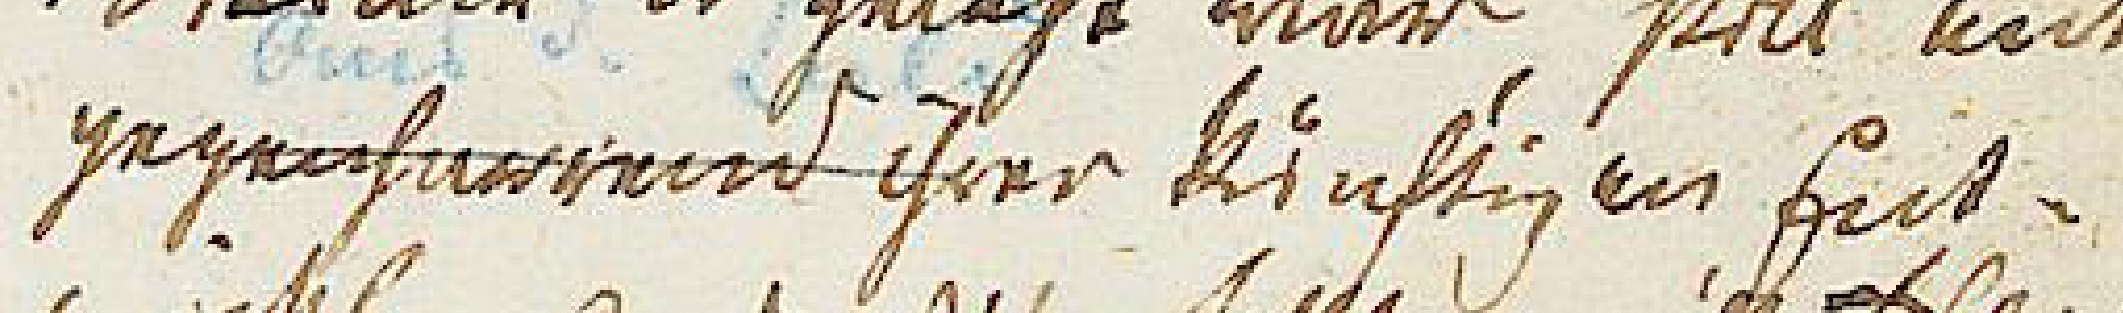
gegenharrend ihrer kräftigen Ent¬
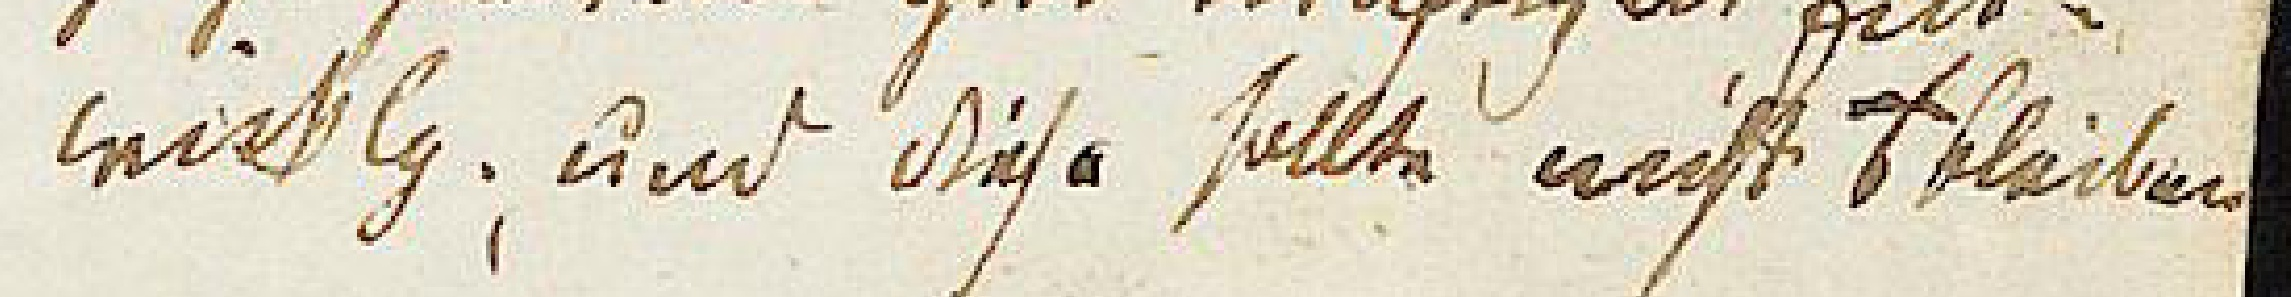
wicklg. und diese sollte nicht sbleiben.
